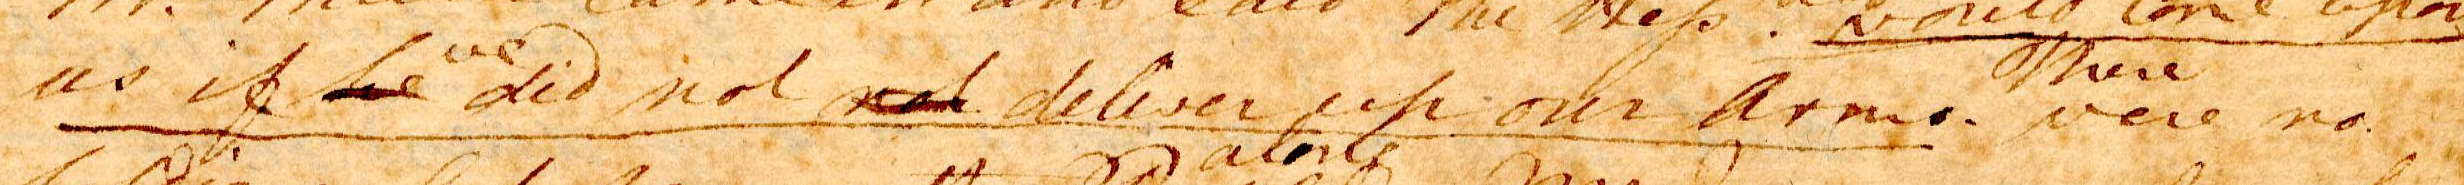us if [he] ^we did not [not] deliver up our Arms. ^ were no
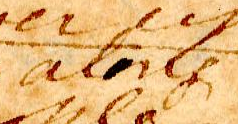alone
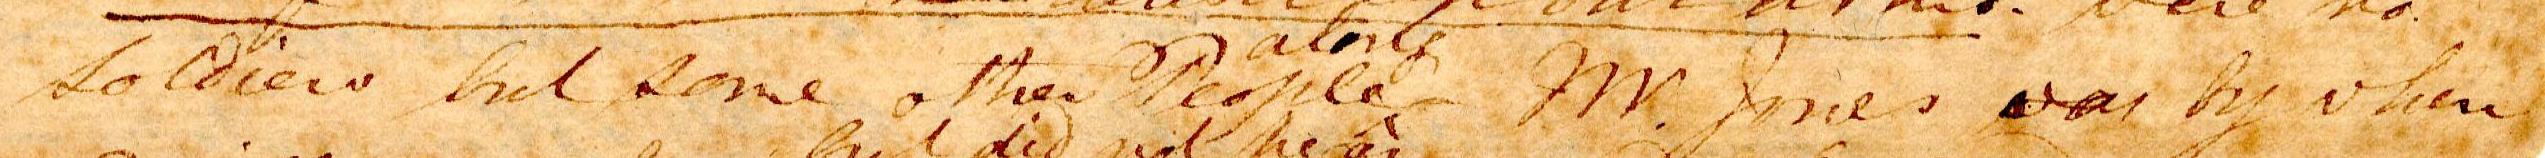Soldiers but some other ^ People. M^r. Jones was by when
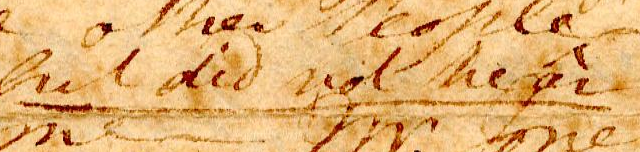but did not hear
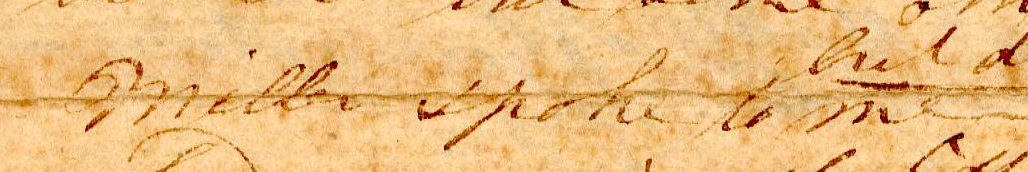Miller spoke to me
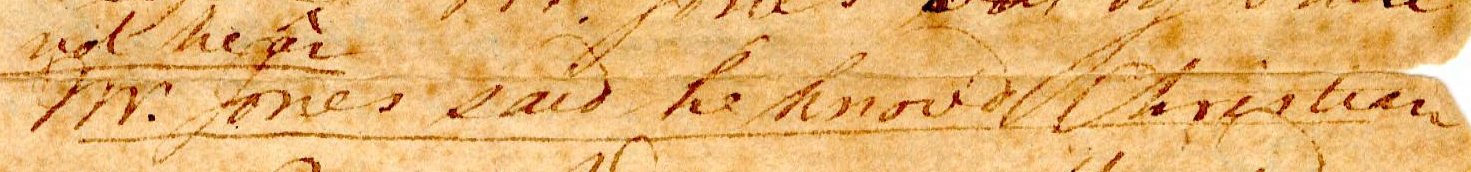M^r. Jones said he know'd Christian
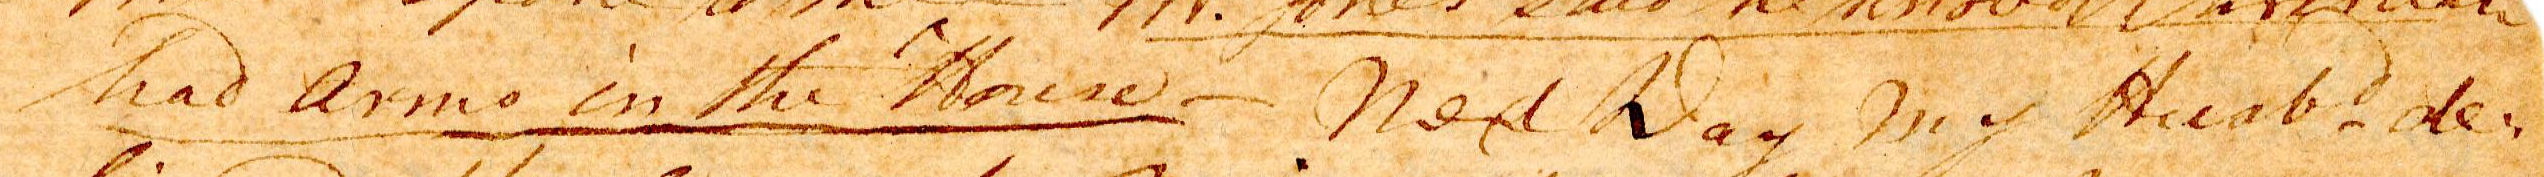had Arms in the House. Next Day My Husb^d de-
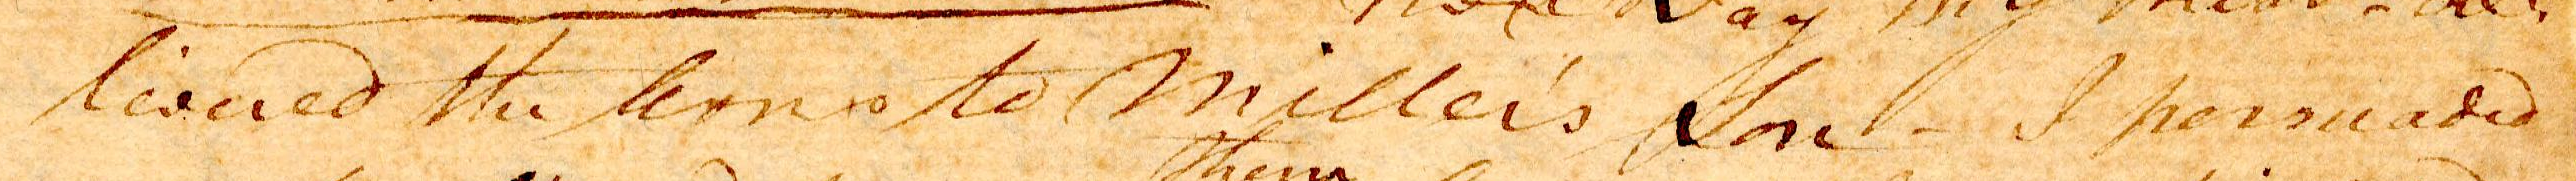livered the Gun to Miller's Son. I persuaded
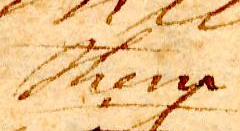them
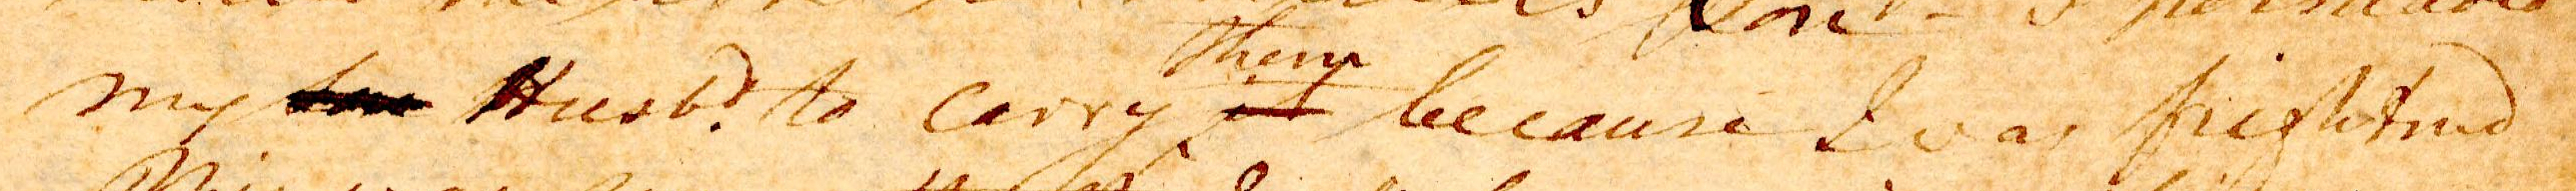my [son] Husb^d. to carry ^ because I was frightened
